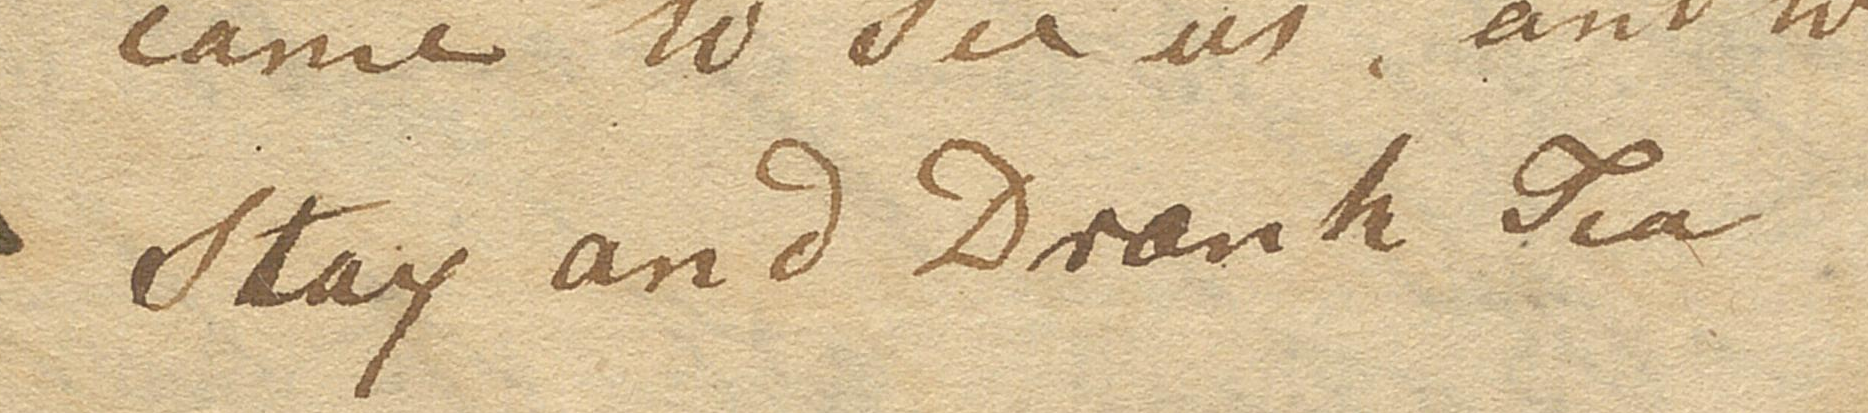Stay and Drank Tea
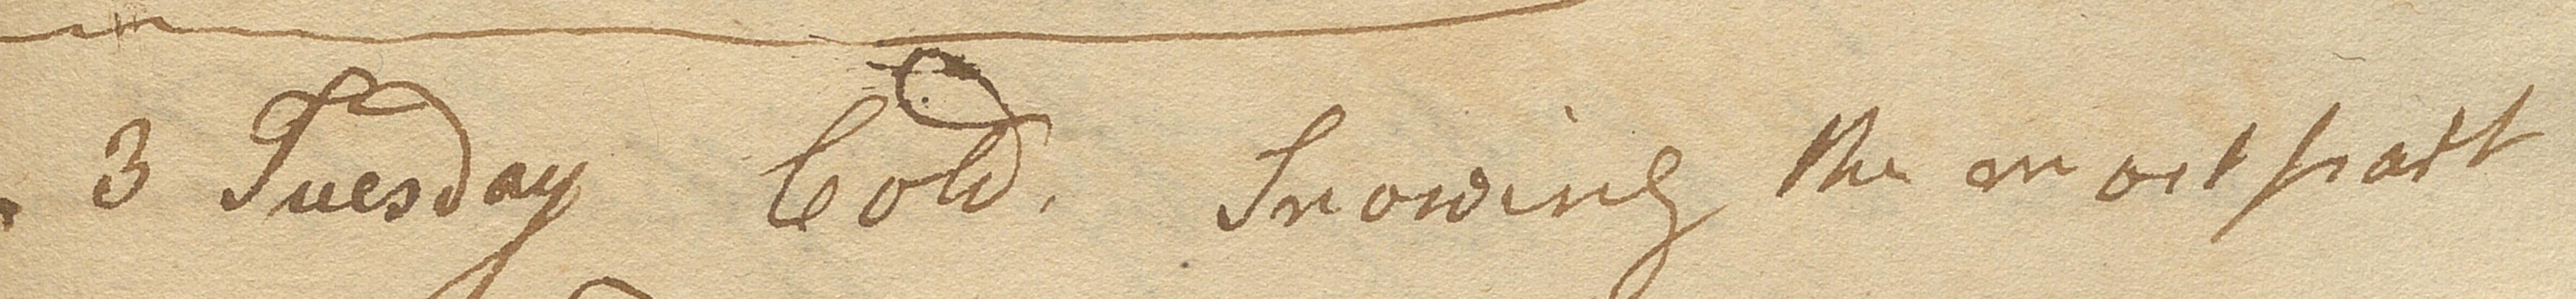3 Tuesday Cold. Snowing the most part
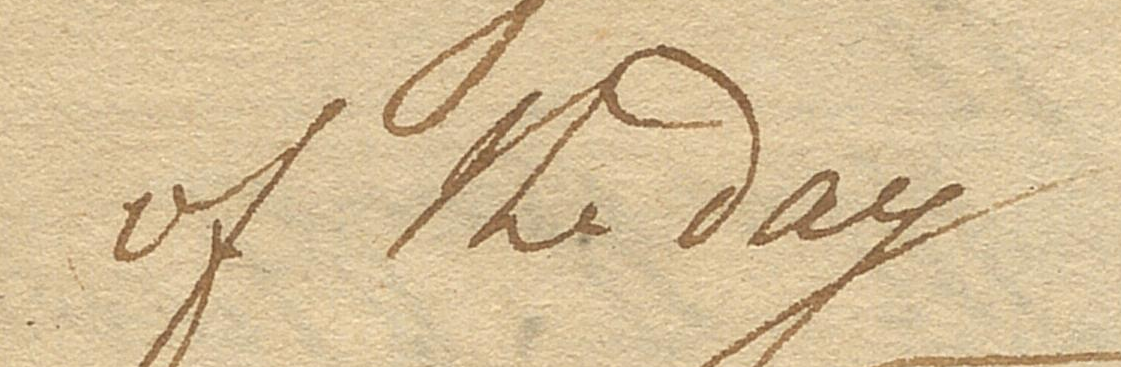of the day
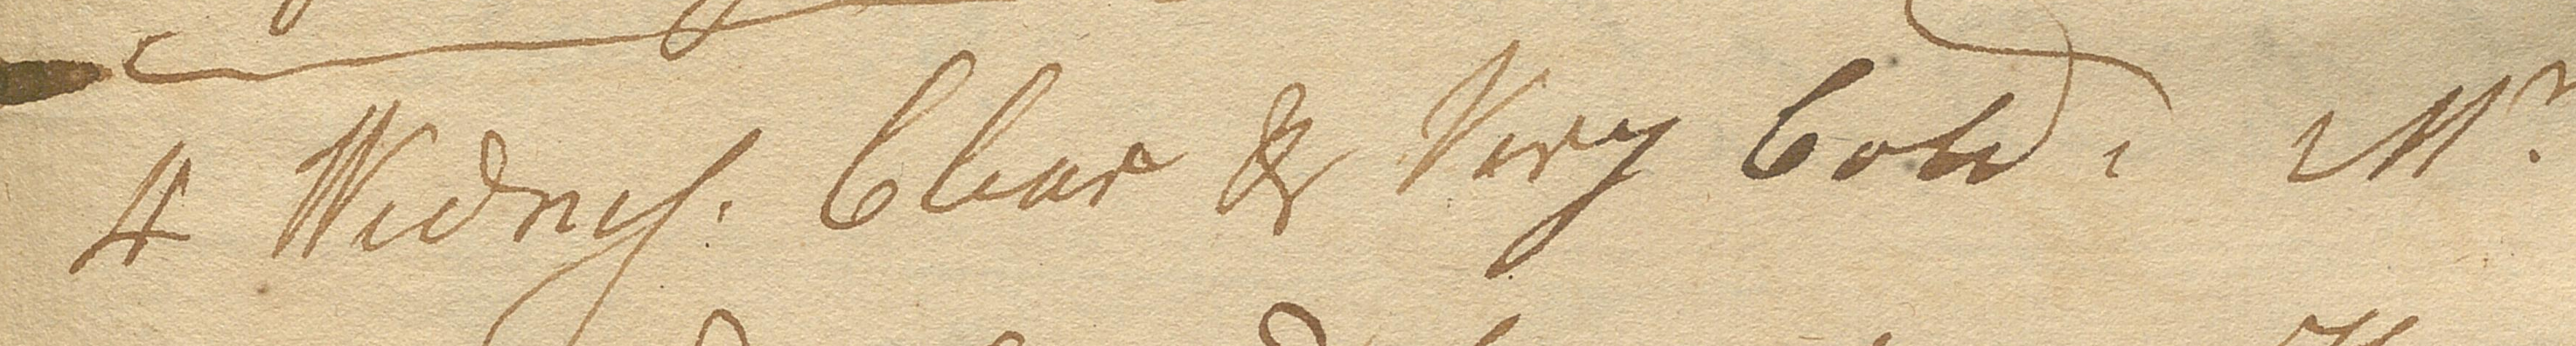4 Wednes. Clear & Very Cold. M^r.
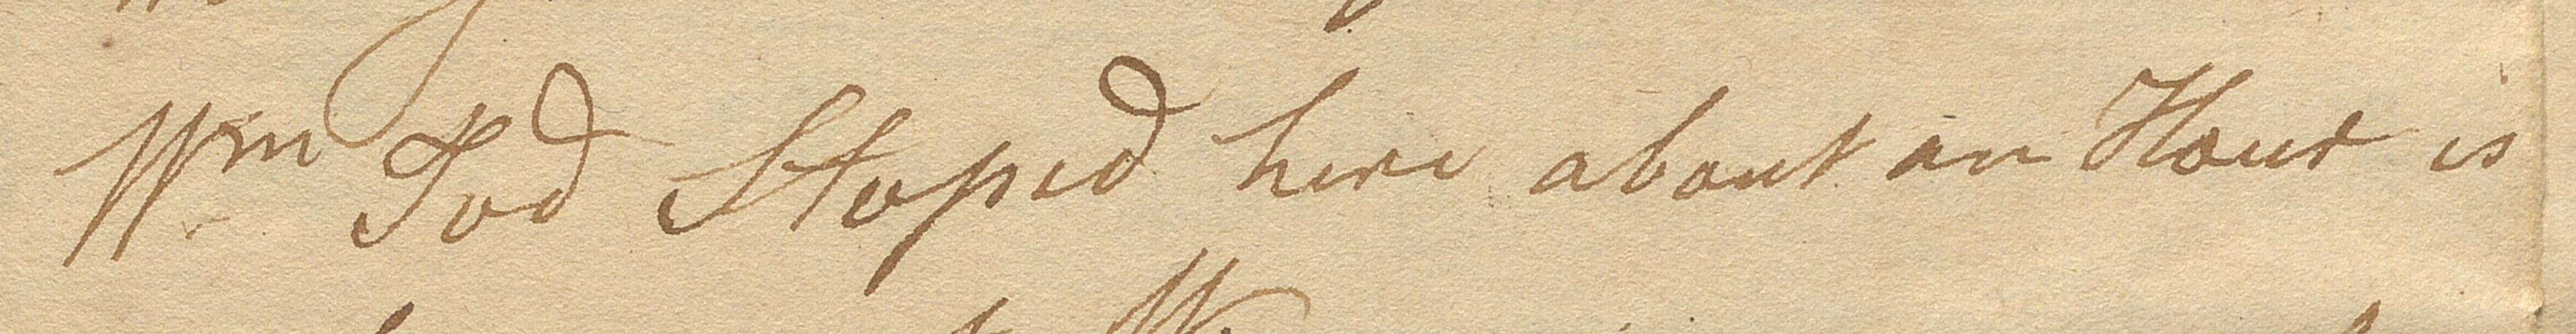W^m Tod Stoped here about an Hour is
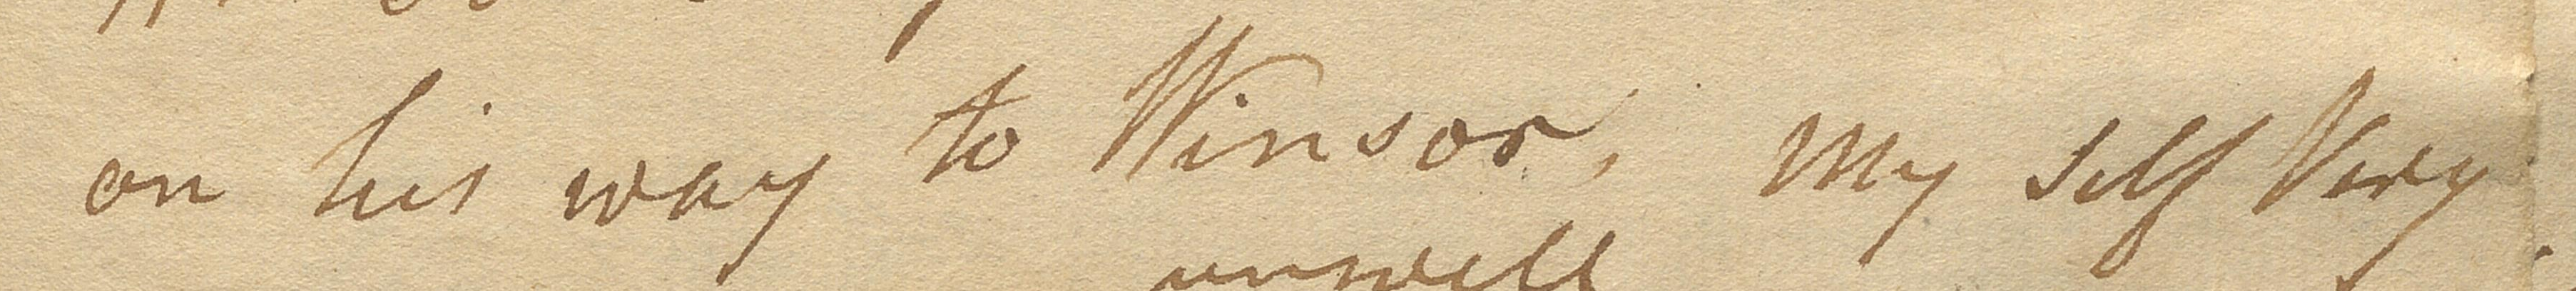on his way to Winsor, My self Very
